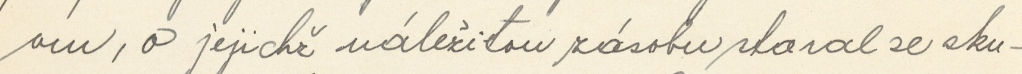vín, o jejichž náležitou zásobu staral se sku-
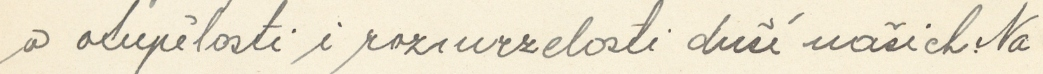v otupělosti i rozmrzelosti duší našich. Na-
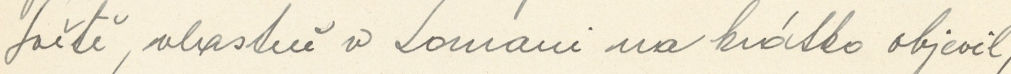Světě, vlastně v Somani na krátko objevil,
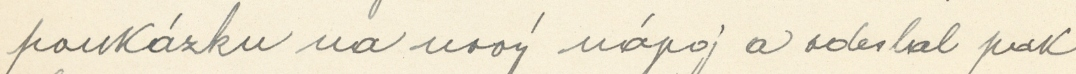poukázku na nový nápoj a odeslal pak
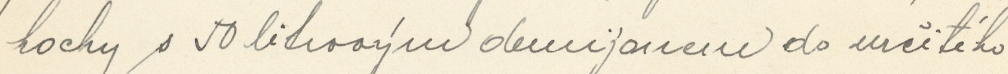hochy s 50 litrovým demijonem do určitého
